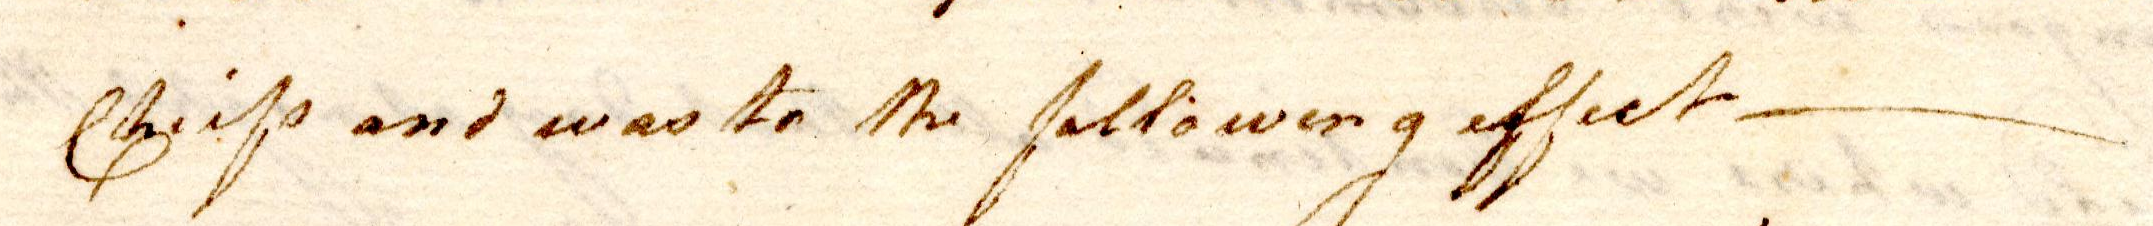Cheifs and was to the following effect-
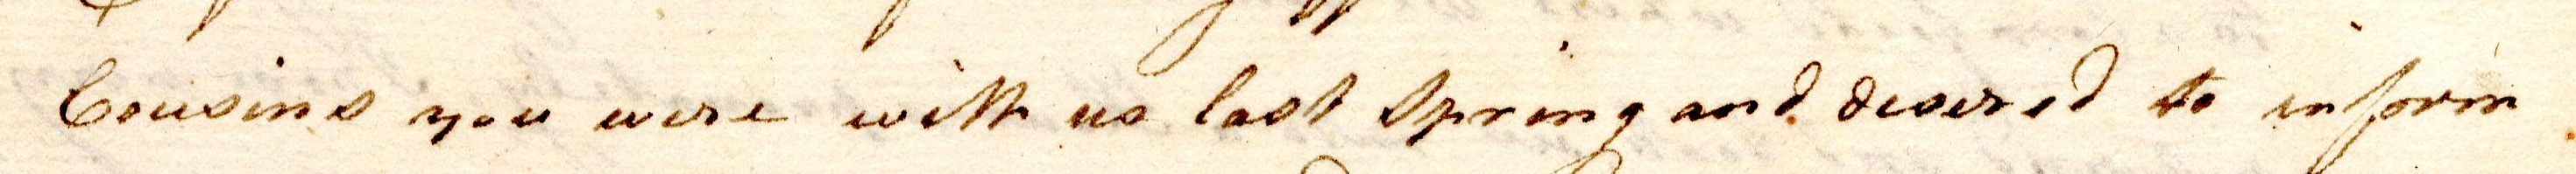Cousins you were with us last spring and desired to inform
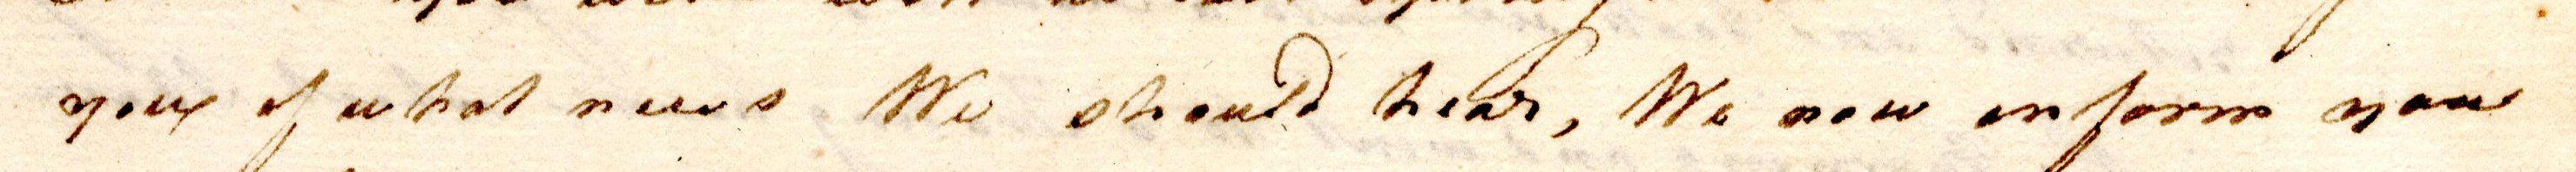you of what news We should hear, We now inform you
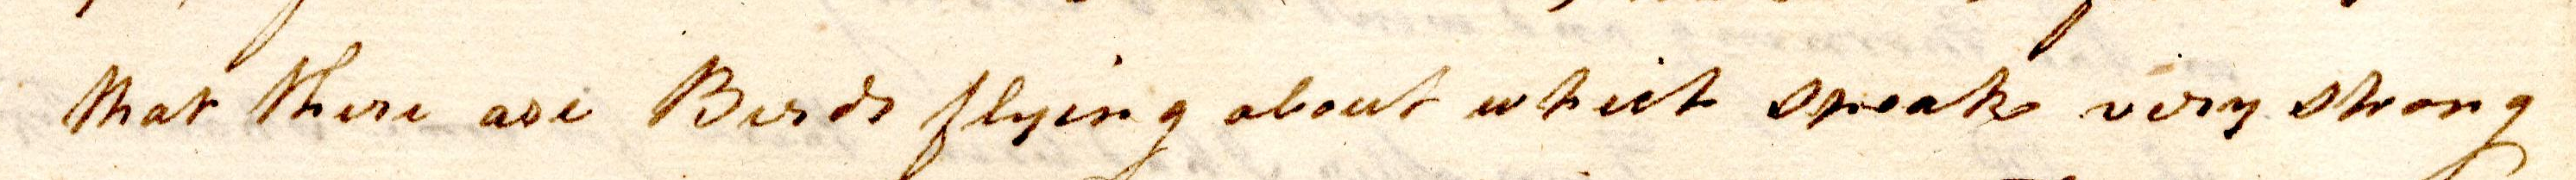that there are Birds flying about which speak very strong
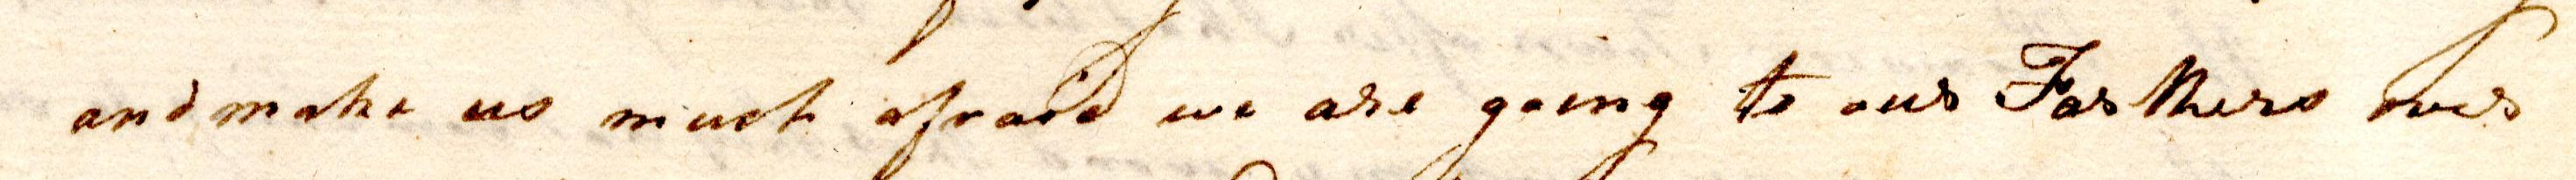and make us much afraid we are going to our Farthers over
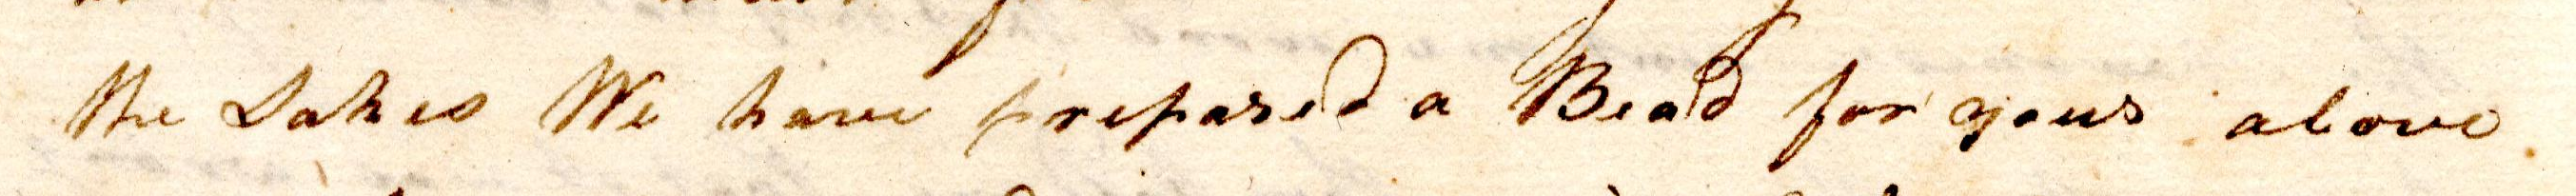the Lakes We have prepared a Bead for you above
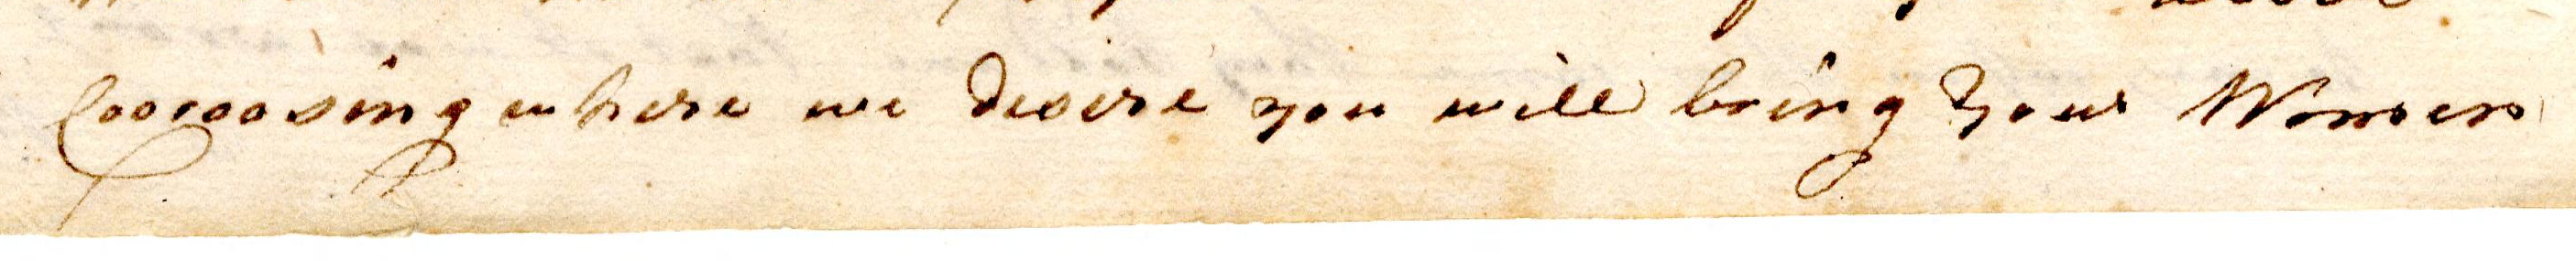Cooroosing where we desire you will bring your Women
